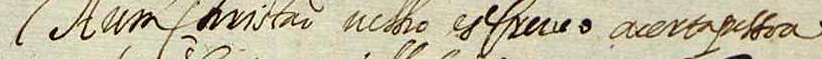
Hum Christaõ uelho esCreueo a certa pessoa
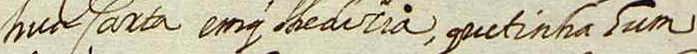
hua Carta em q̄ lhe dizia, que tinha hum
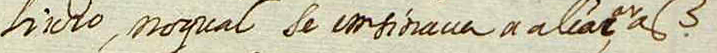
liuro, no qual se emsinaua a alcāçar as
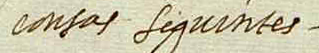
cousas seguintes
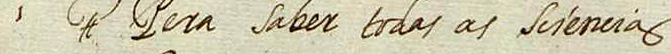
1 item Pera saber todas as sciencias
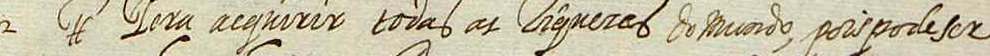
2 item Pera acquirir todas as Riquezes do mundo, pois pode ser
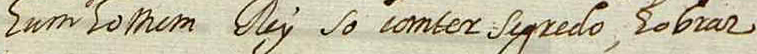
hum homem Rey so com ter segredo, E obrar
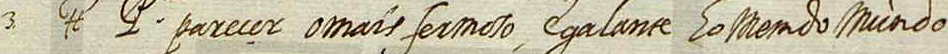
3 item P.a parecer o mais fermoso, e galante homem do mundo
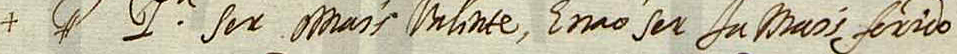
4 item P.a ser o mais Valente, E naõ ser Jamais ferido
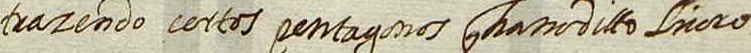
trazendo certos pentagonos q̄ ha no ditto Liuro
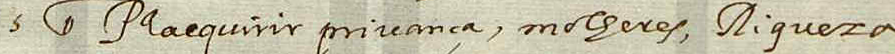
5 item Pa acquirir priuança, molheres, Riqueza
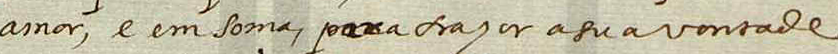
amor, e em soma, pera trazer a sua vontade
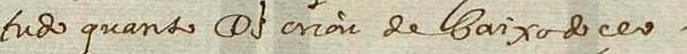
tudo quanto Ds̄ criou debaixo do ceo
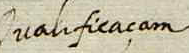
Qualificaçam
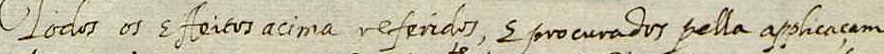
Todos os Efeitos acima referidos, E procurados pella applicaçam
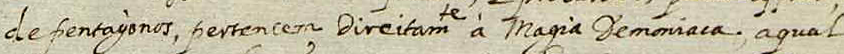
de pentagonos, pertencem direitamte à Magia Demoniaca. a qual
